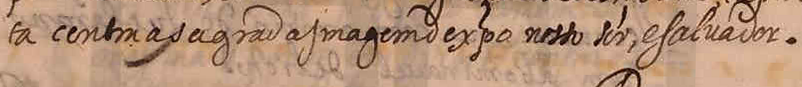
ta contra a sagrada Jmagem de xp̄o nosso sōr, e Saluador.
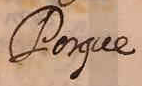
Porque
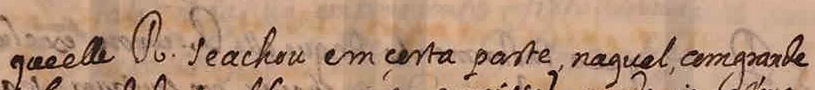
que elle R. se achou em çerta parte, na qual, com grande
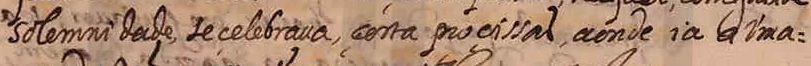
solemnidade se celebraua, certa procissaõ aonde ia a Ima
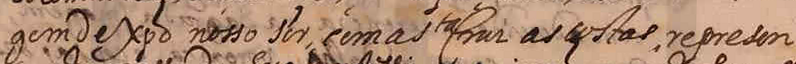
gem de Xpō nosso sōr, com a sta Cruz as costas, represen
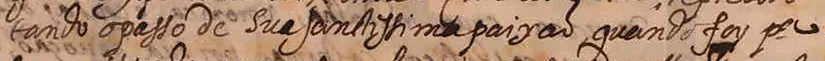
tando o passo de sua Sanctissima paixaõ quando foy pa
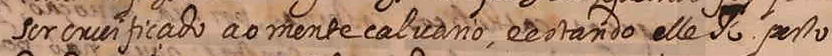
ser crucificado ao monte caluario, e estando elle R. perto
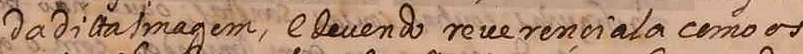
da ditta Imagem, e deuendo reuerençiala como os
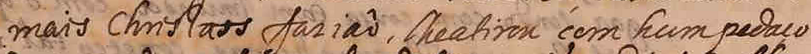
mais Christaos faziaõ, lhe atirou com hum pedaço
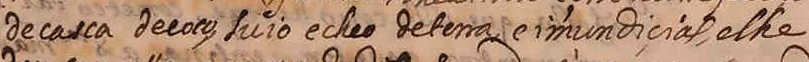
de casca de coco, suio e cheo de terra, e im̄undiçias, e lhe
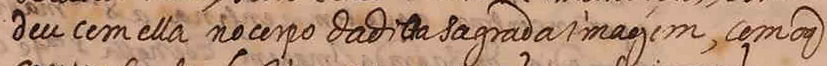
deu com ella no corpo da ditta sagrada imagem, com o q̄
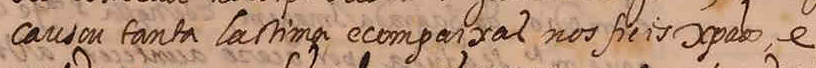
causou tanta lastima e compaixaõ nos fieis xpaõs, e
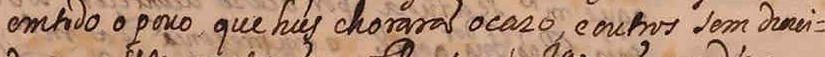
em todo o pouo que hūs chorarā o cazo, e outros sem duui
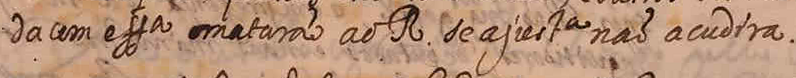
da com eff.a o matarão ao R. se a justa naõ acudira
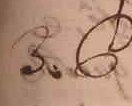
3. P
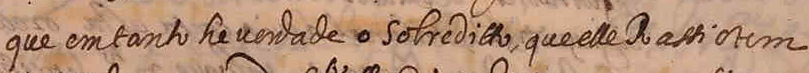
que em tanto he uerdade o Sobreditto, que elle R assi o tem
